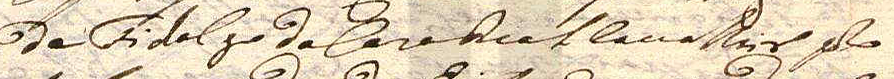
de Fidalgo da Caza Real Caualheiro pRo
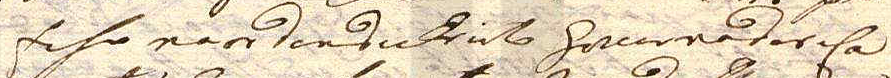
feso na orden de christo Gouernador e Ca
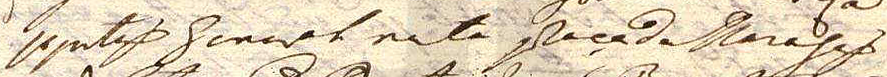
ppitaõ General nesta pRaça de Mazagaõ
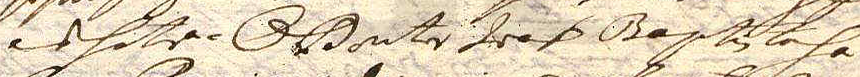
edsetra O Doutor Ioaõ Baptista sa
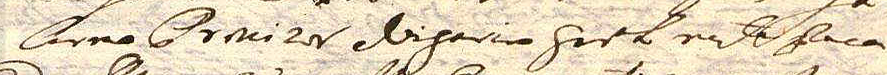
lerno Prouizor e Vigario Geral nesta Praça
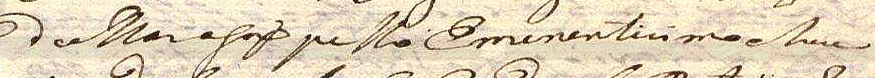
de Mazagaõ pello Emenentisimo e Reue
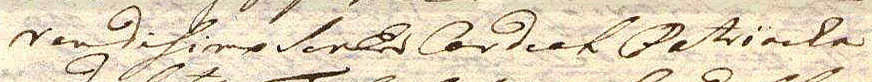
rendisimo Senhor Cardeal Patriacha
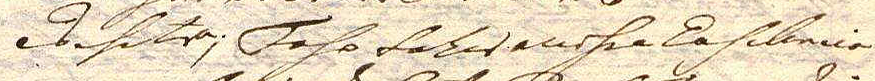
edesetra; Faso saber a uossa Exselencia
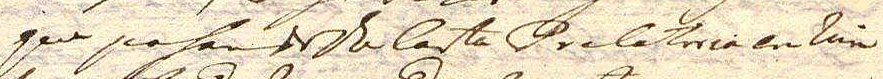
que pasandolhe Carta PreCatoria em Vin
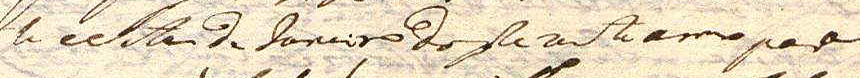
te e Sete de Ianeiro do pRezente anno para
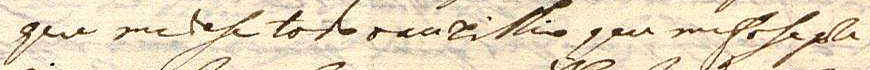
que me dese todo o auzillio que me fose pRe
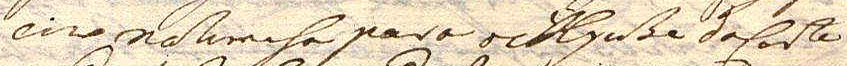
cizo na Remesa para o Alyube da Corte
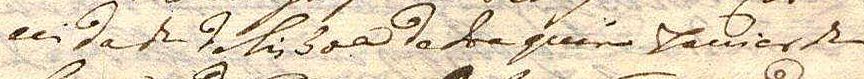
a cidade de Lisboa de Ioaquim Zauier de
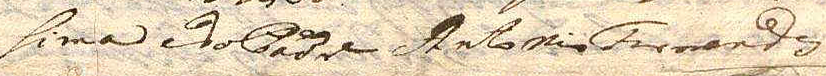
Lima e do Padre Antonio Fernandes
